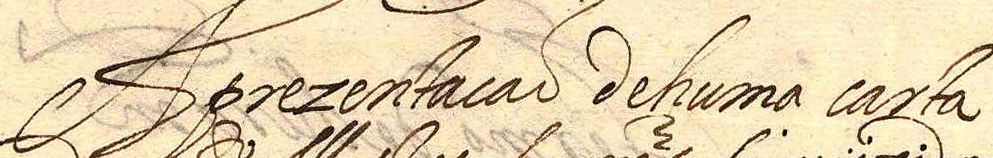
Aprezentaçaõ de huma carta
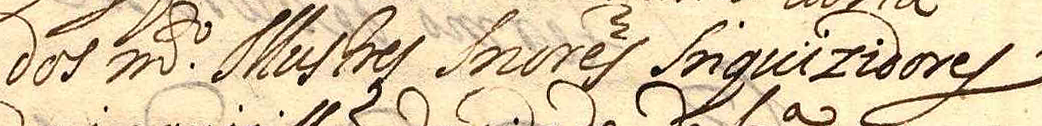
dos mto Illustres Snorēs Inquizidores
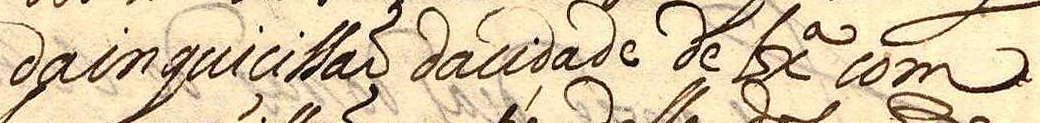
da inquicissão da cidade de Lxa com
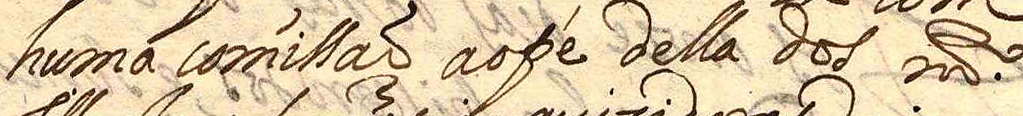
huma comissaõ ao pé della dos m.to
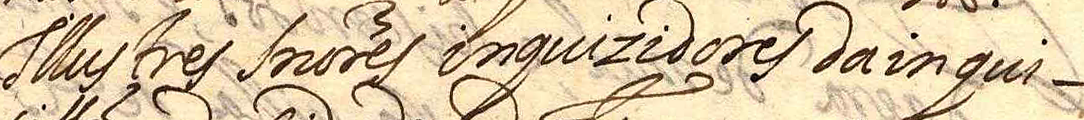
Illustres Snores inquizidores da inqui
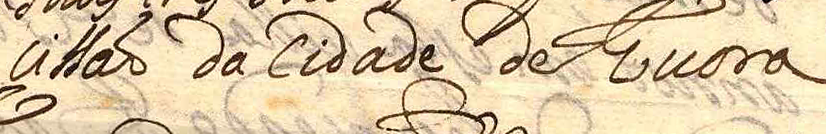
cissão da cidade de Euora
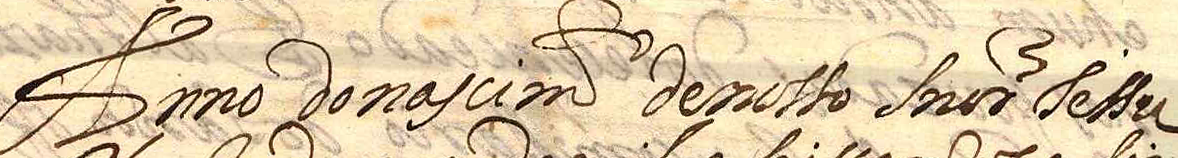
Anno do nascimto de nosso Snor̄ Iessu
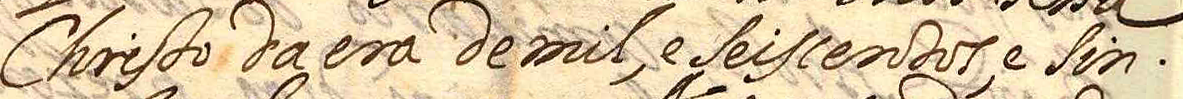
Christo da era de mil, e seiscentos, e sin
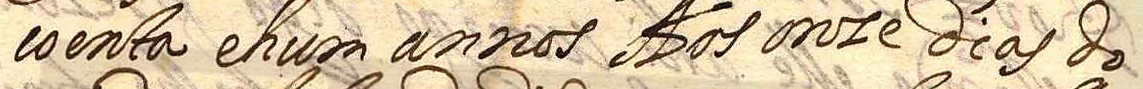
coenta e hum annos Aos onze dias do
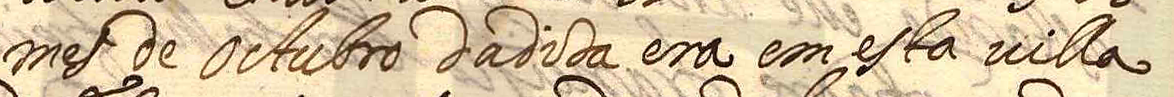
mes de octubro da dita era em esta uilla
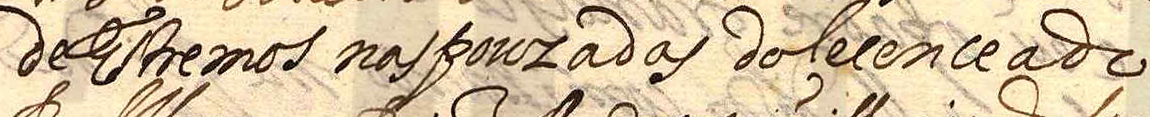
de Estremos nas pouzadas do lecenceado
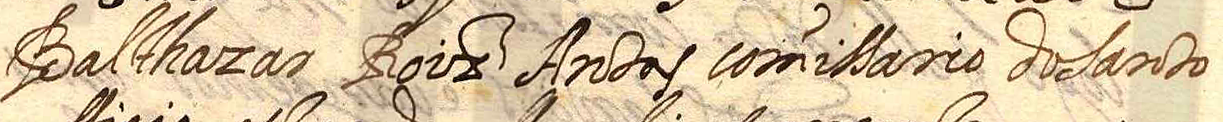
Balthazar Roiz̄ Antas comissario do Santo
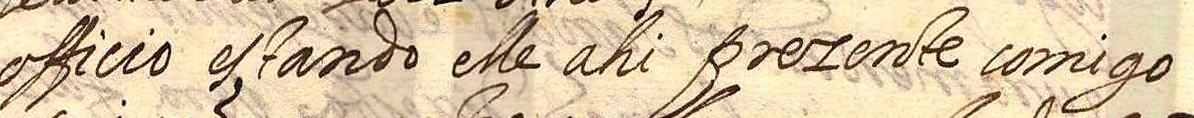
officio estando elle ahi prezente comigo
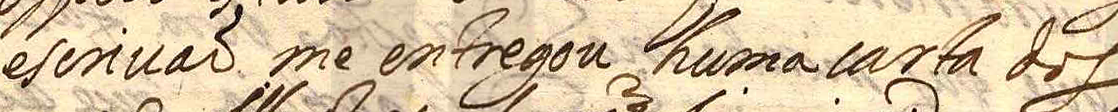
escriuaõ me entregou huma carta dos
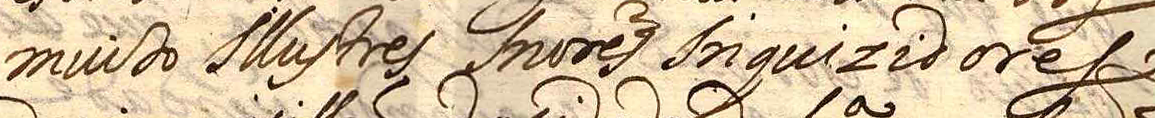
muito Illustres Snorēs Inquizidores
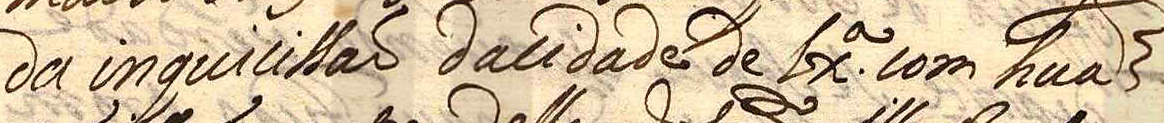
da inquicissão da cidade de Lxa com huā
